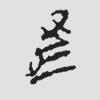獻馬
